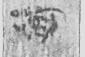百
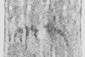廿
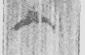六
